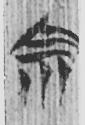宗
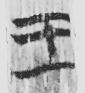王
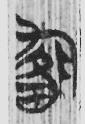{备勻}
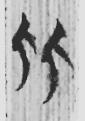比
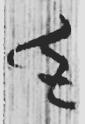氒
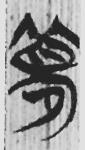夢
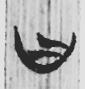曰
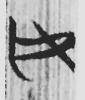女
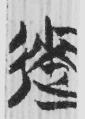逨（來）
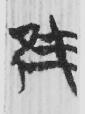隹
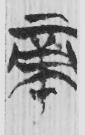帝
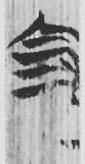命
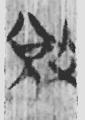敓（說）
